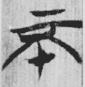不
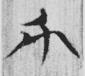介
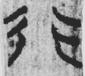行
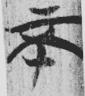不
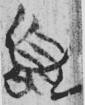頌
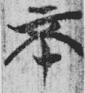不
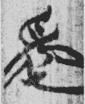○（依）
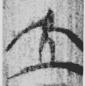立
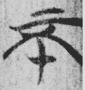不
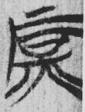庶
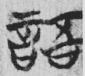語
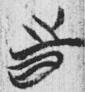時
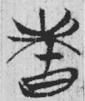昧
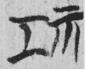{示工}（攻）
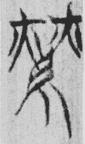○（禜）
